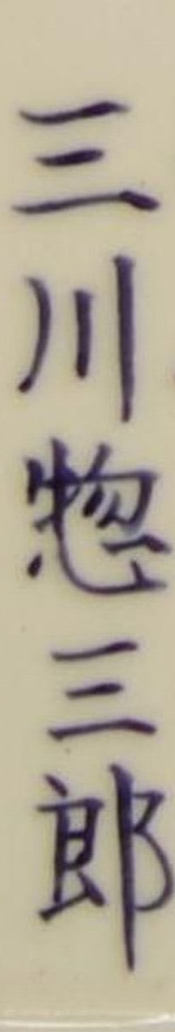三川惣三郎

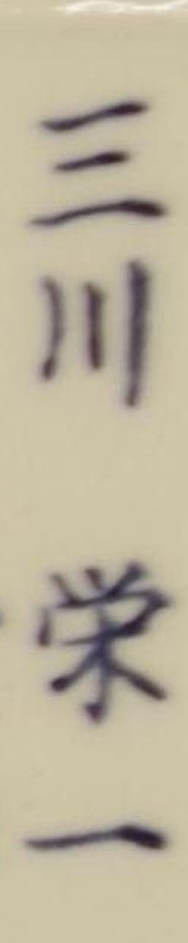三川栄一
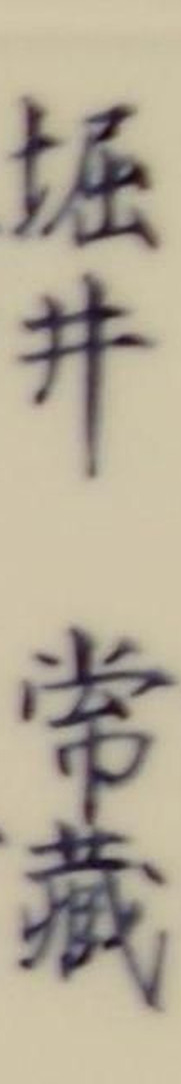堀井常蔵
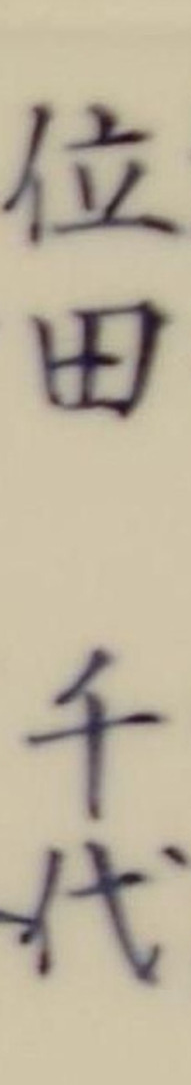位田千代
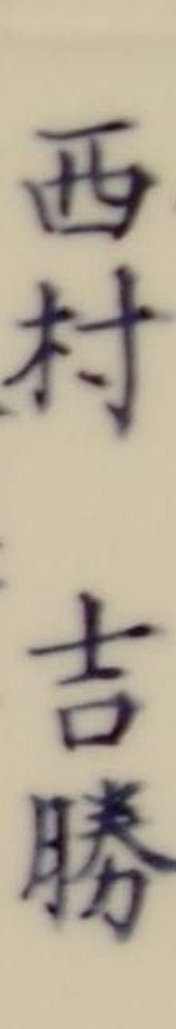西村吉勝
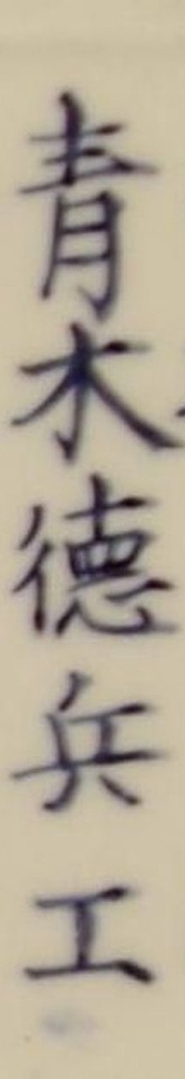青木徳兵ヱ
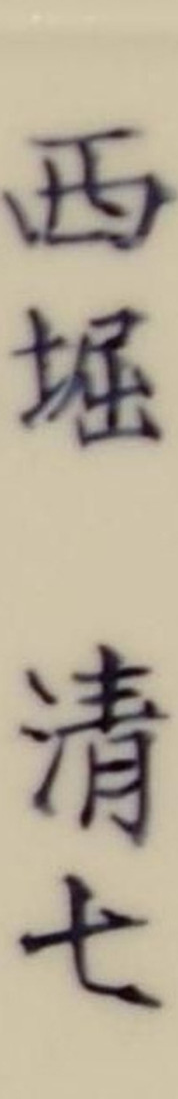西堀清七
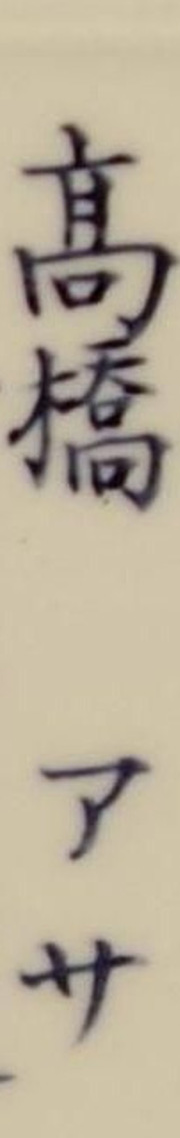高橋アサ
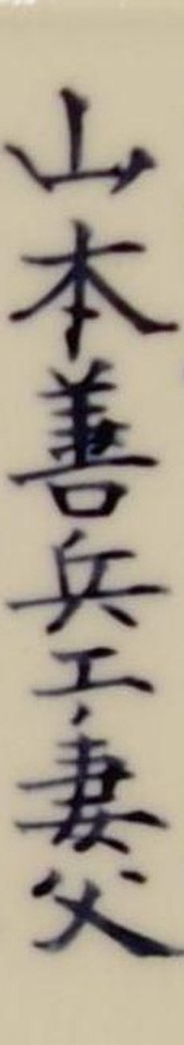山本善兵エ妻父
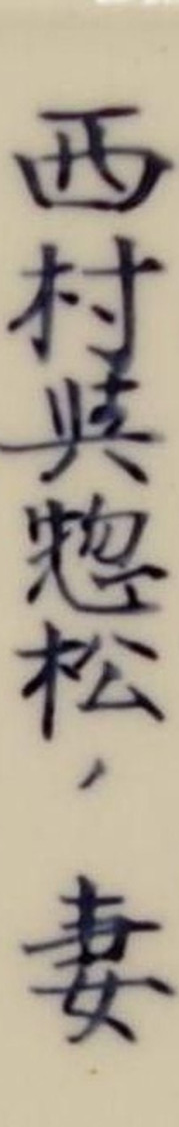西村与惣松ノ妻
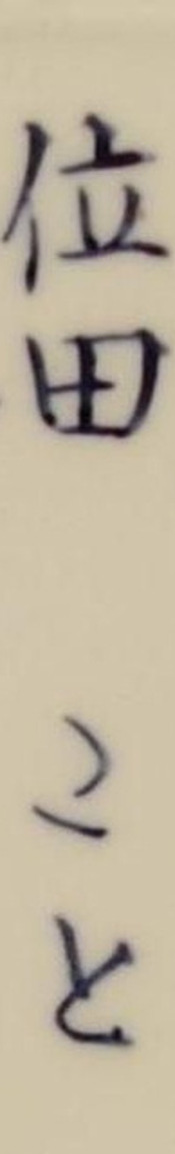位田たと
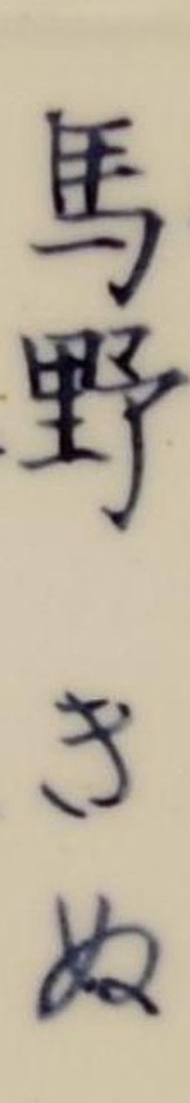馬野きぬ
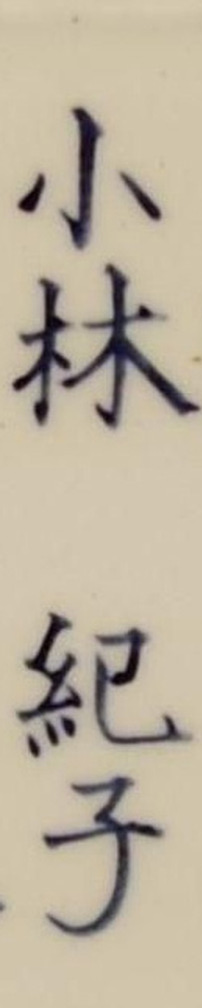小林紀子
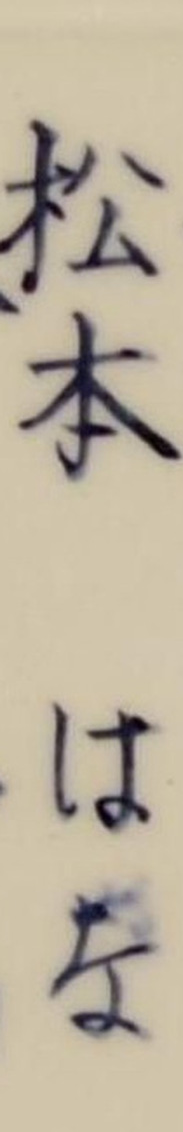松本はな
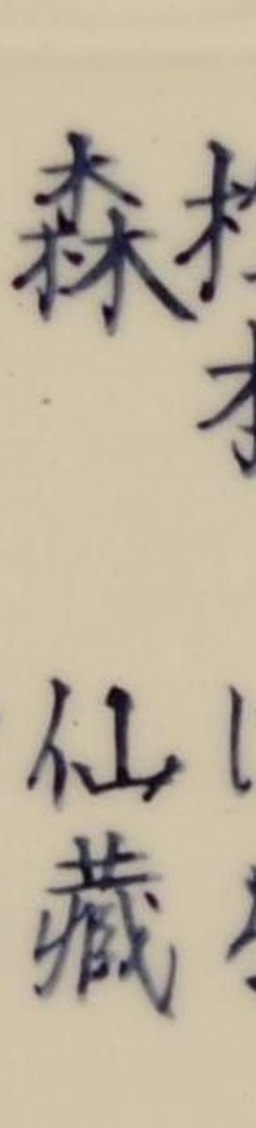森仙蔵
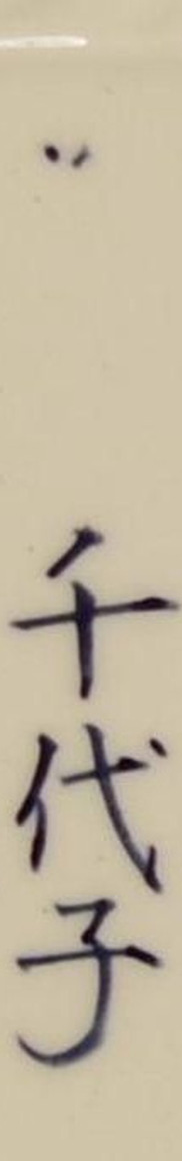千代子
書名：E~L
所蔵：高野山金剛峯寺
